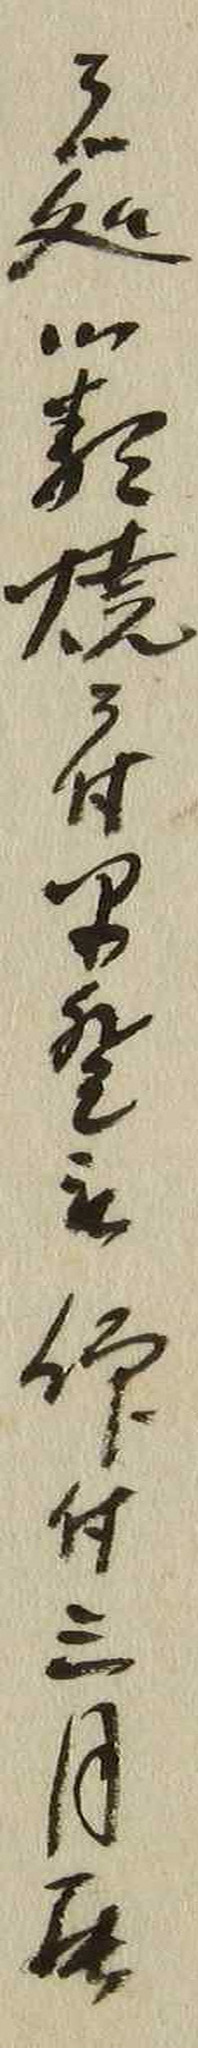ニ候処御類焼ニ付早発被仰付三月罷
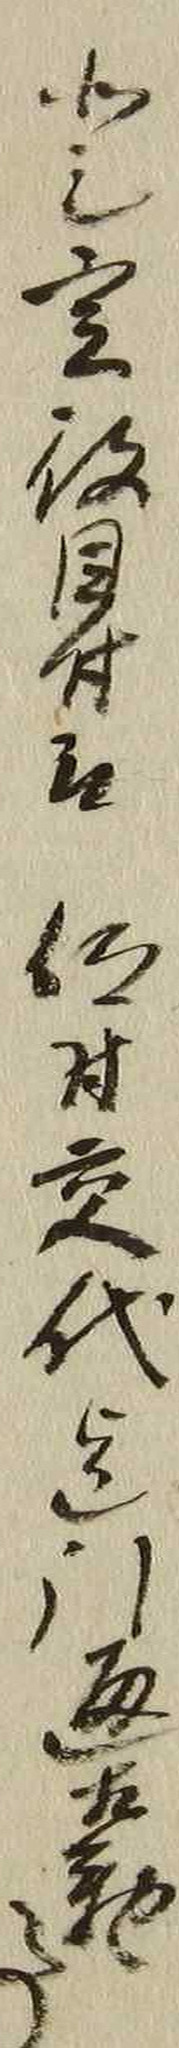登定役目付被仰付交代迄引通相勤候
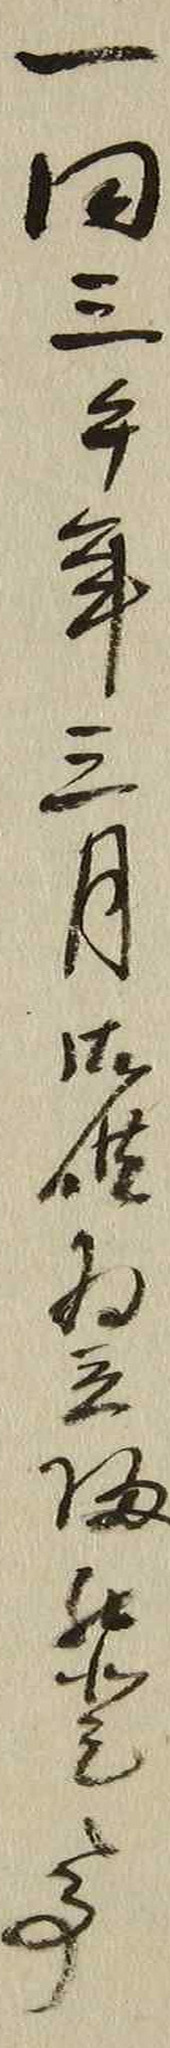一同三午年三月御暇為立帰罷登候候
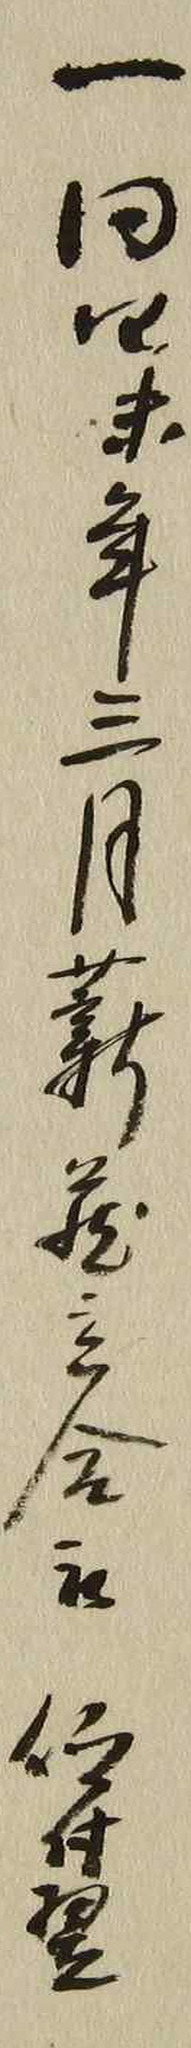一同四末年三月薪蔵立合被仰付翌
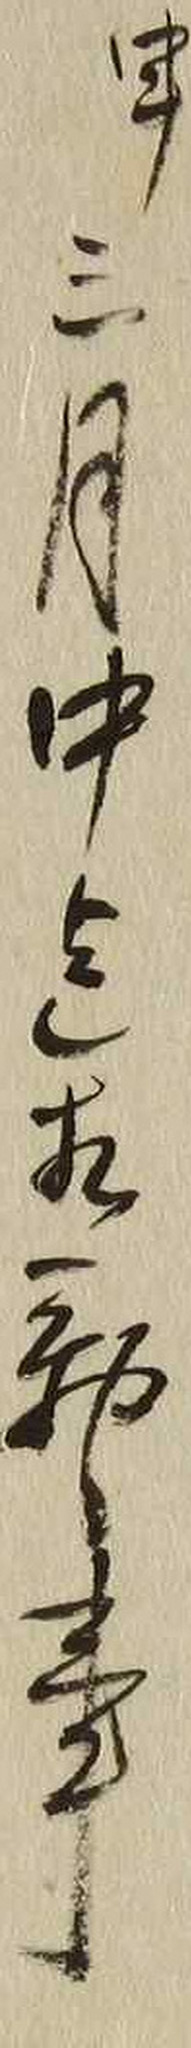申三月中迄相勤候事
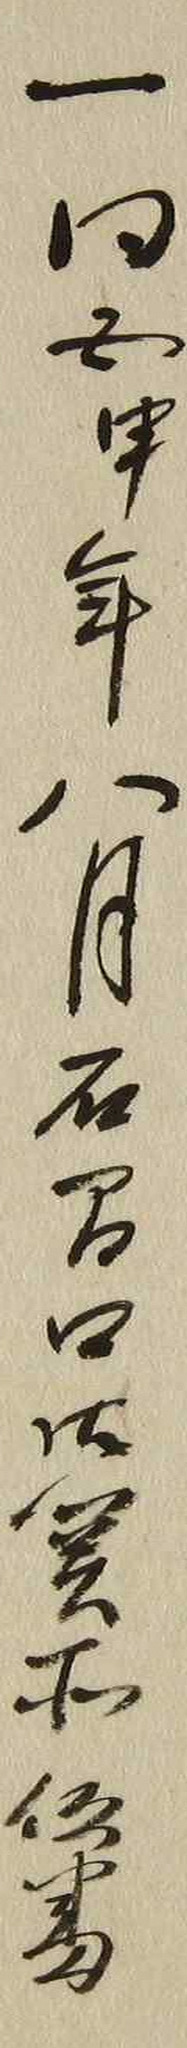一同五申年八月石間口御関所仮番
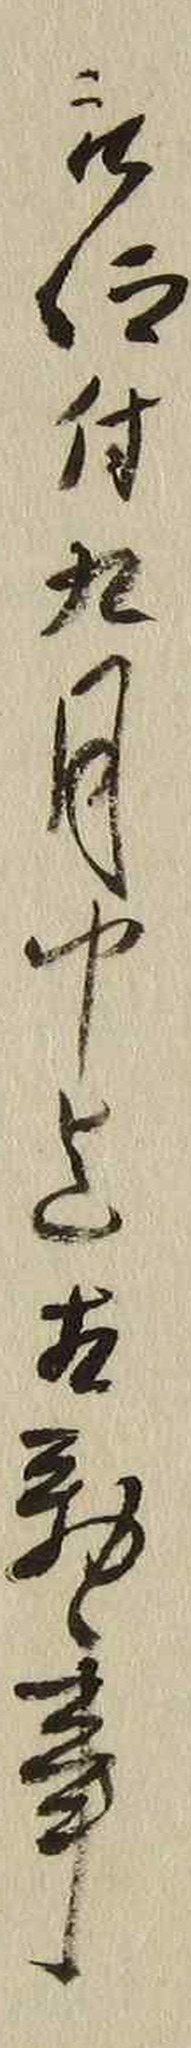被仰付九月中迄相勤候事
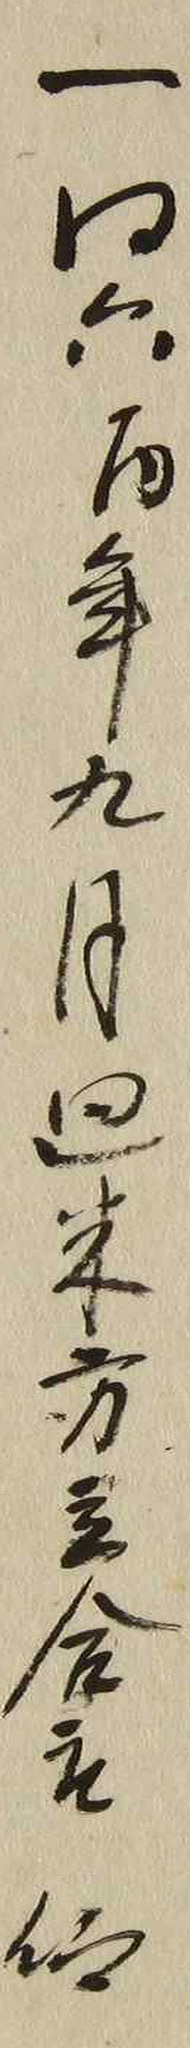一同六酉年九月廻来方立合被仰
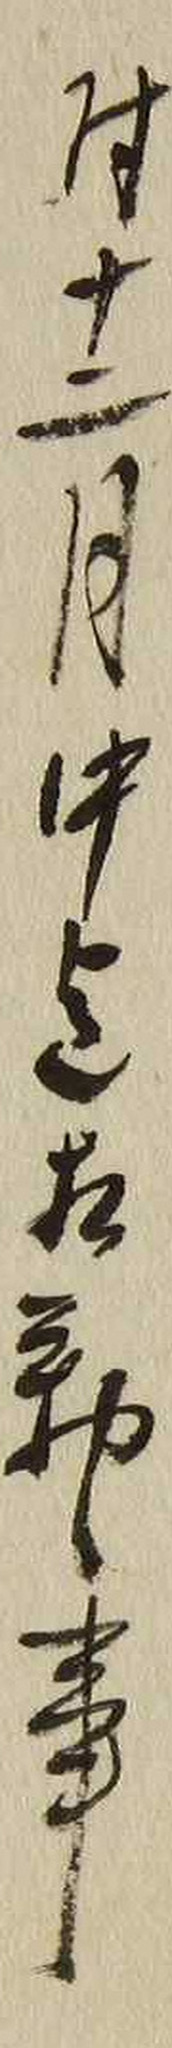付十二月中迄相勤候事
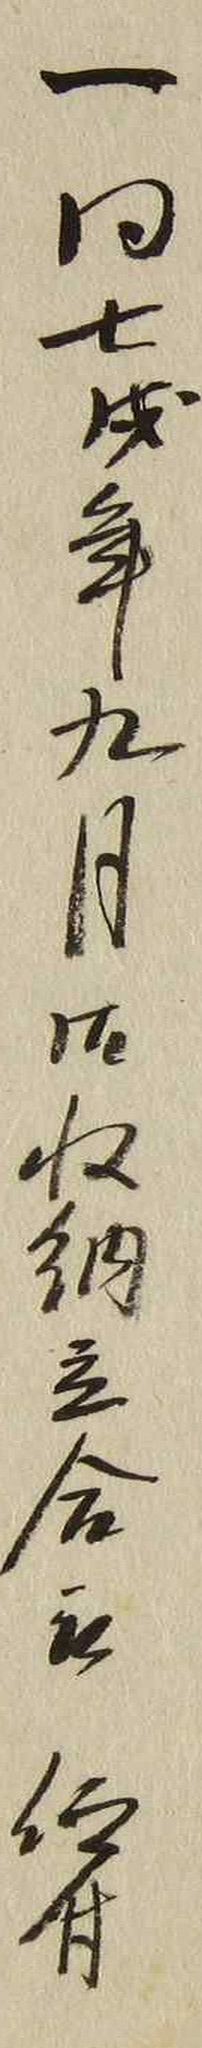一同七戌年九月御収納立合被仰付
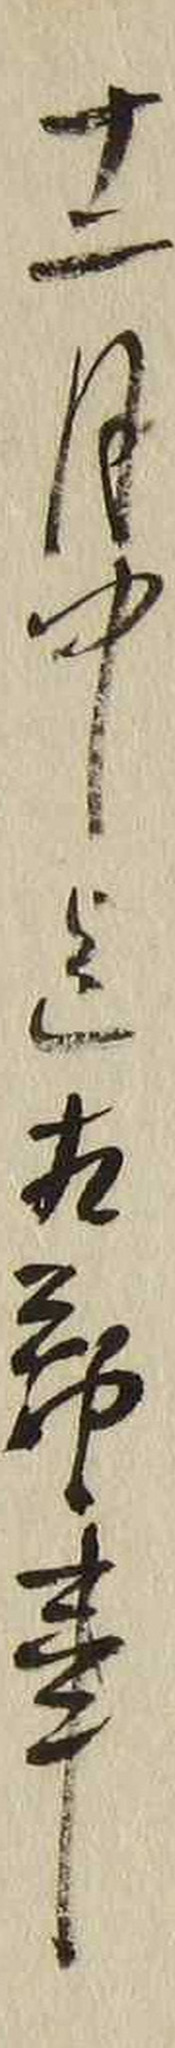十二月中迄相勤候事
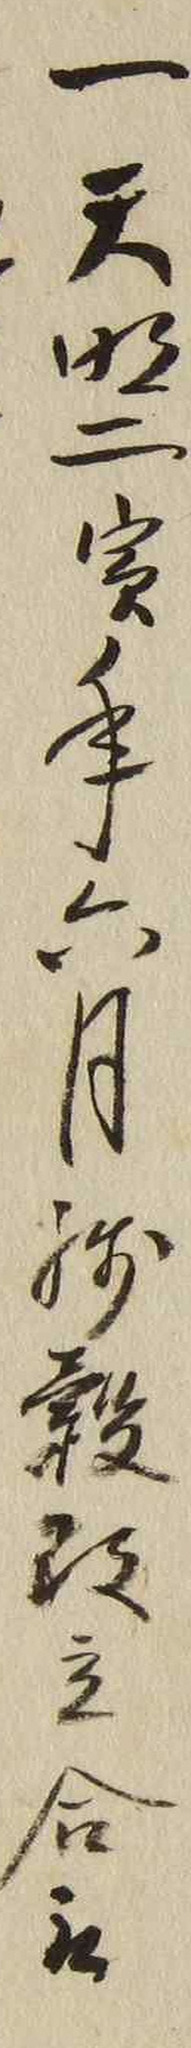一天明二寅年六月残穀改立合被
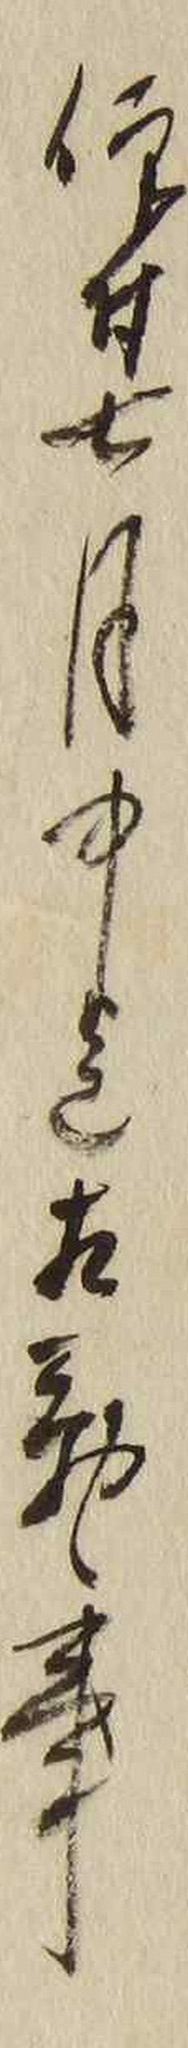仰付七月中迄相勤候事

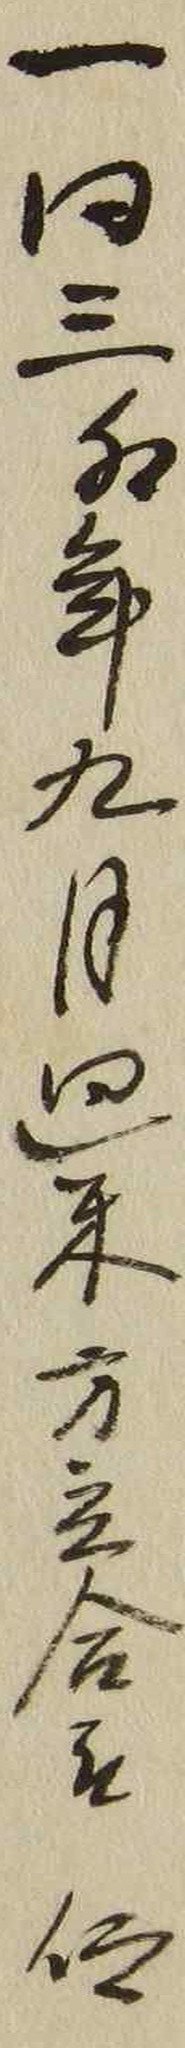一同卯年九月廻米方立合被仰
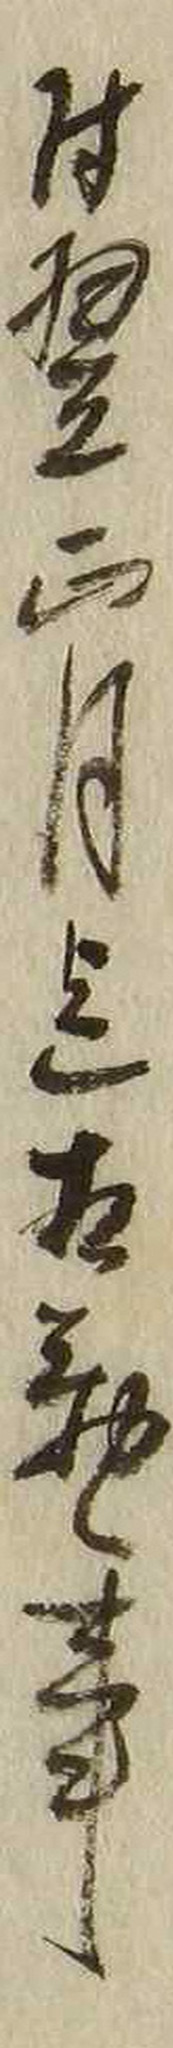付翌正月迄相勤候事
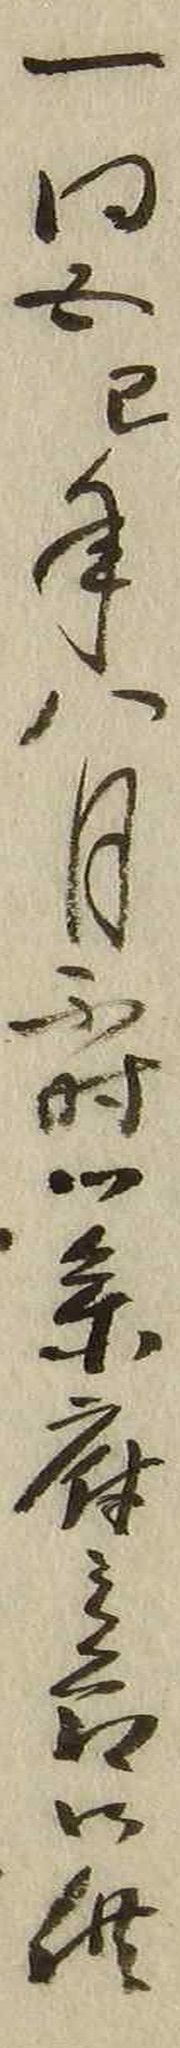一同五巳年八月不時御参府之節御供
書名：諸士系譜　巻之360　す之部10
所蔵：会津若松市立会津図書館
